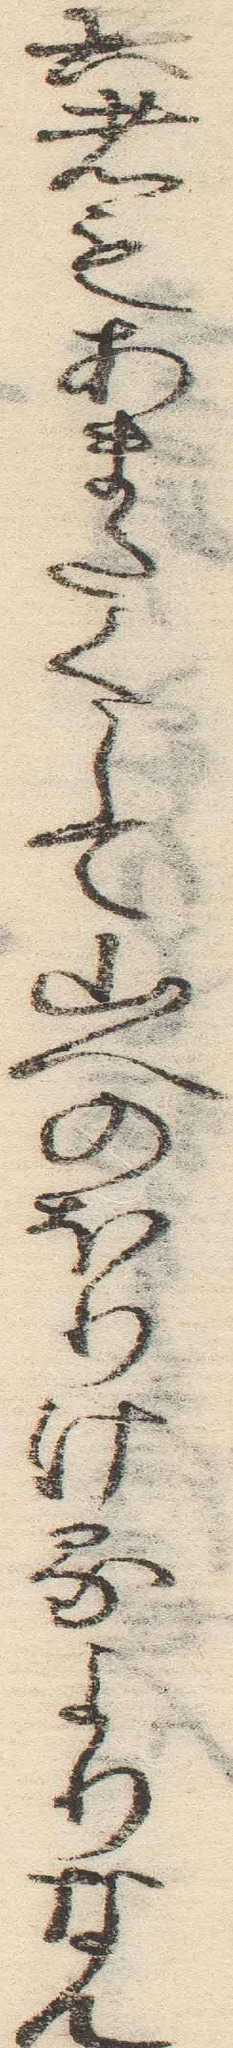兵者もあまたくして山へのほりけるよりなん
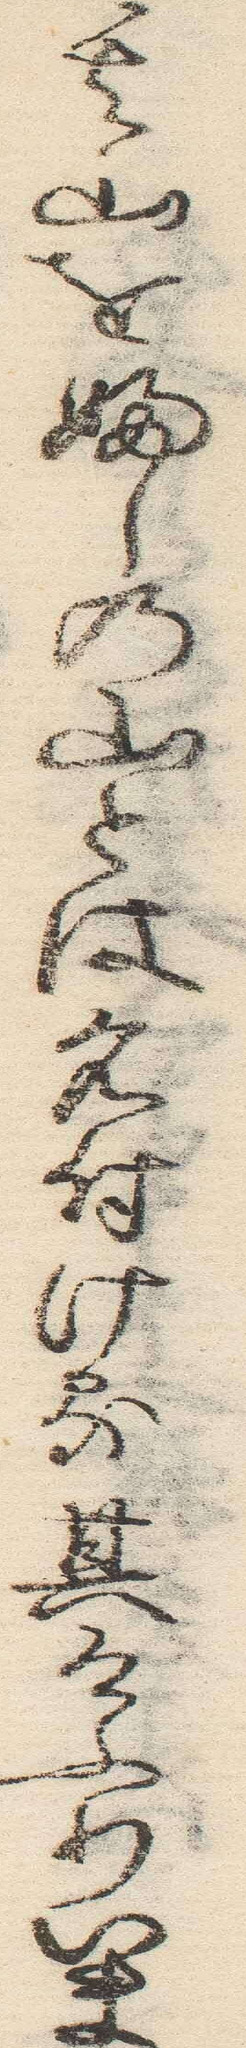其山をふしの山とは名付ける其けふりいま
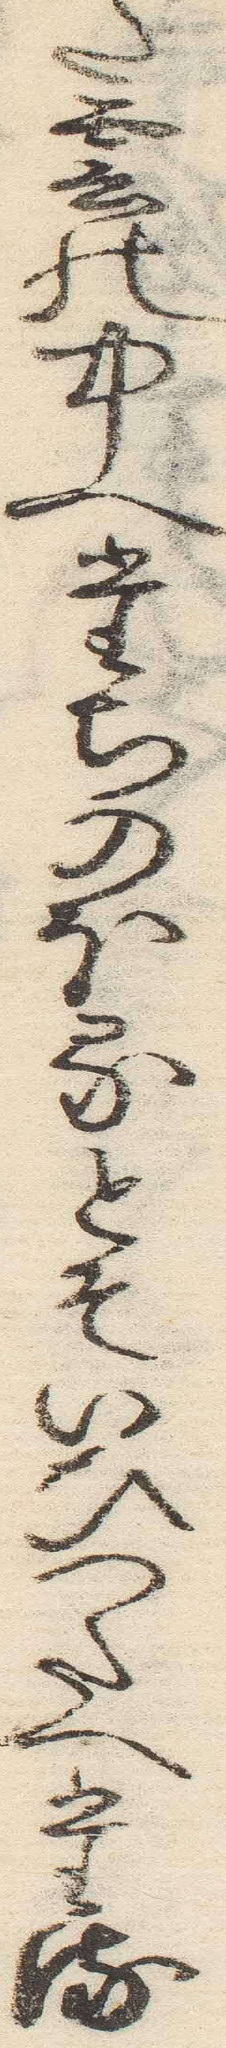た雲の中へたちのほるとそいひつたへたる
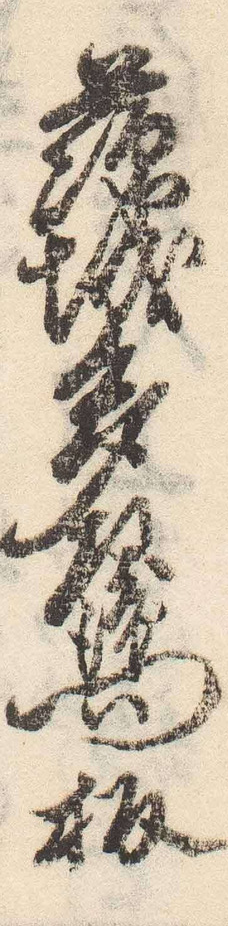茨城多左衛門尉板
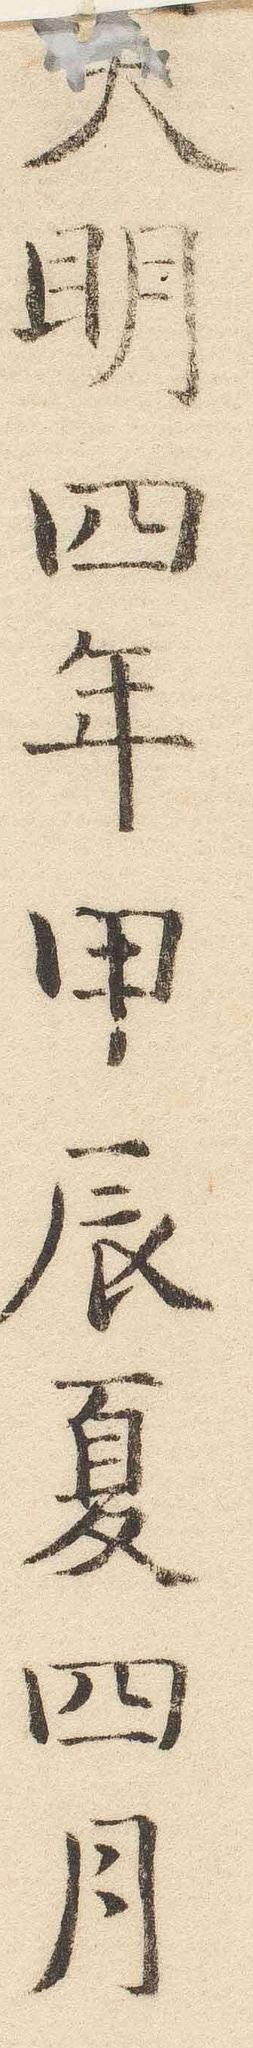天明四年甲辰夏四月
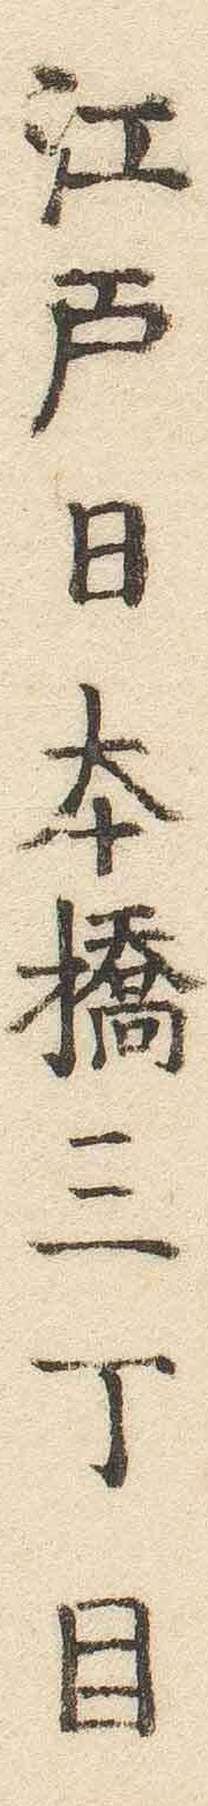江戸日本橋三丁目
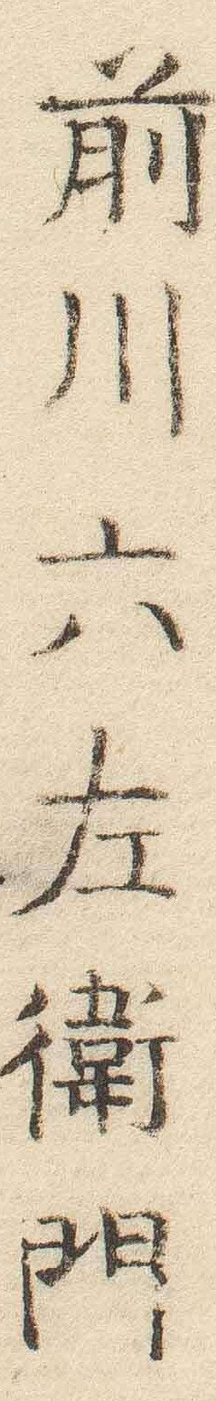前川六左衛門
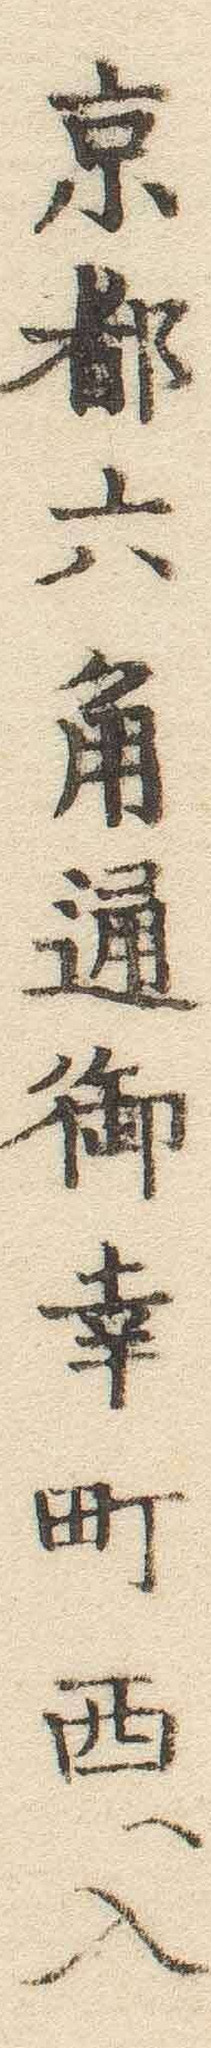京都六角通御幸町日へ入
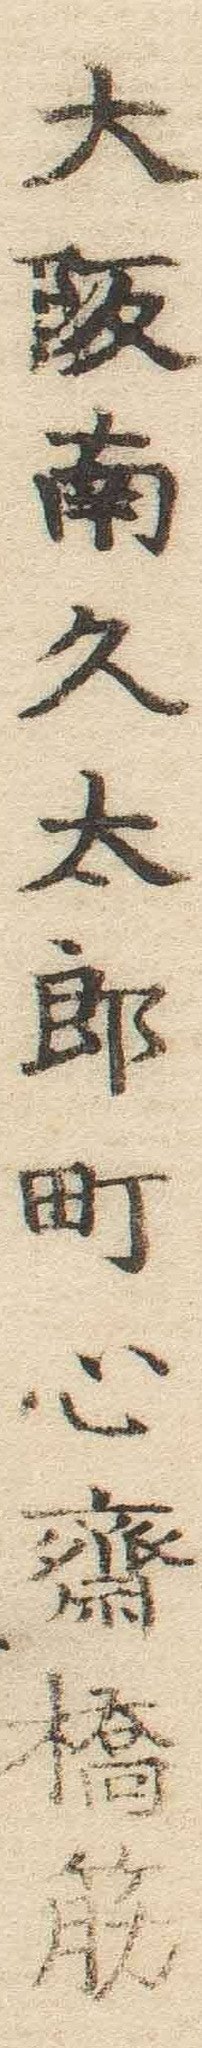大阪南久太郎町心齋橋筋
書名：竹取物語
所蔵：東京学芸大学附属図書館 国文学研究資料館
